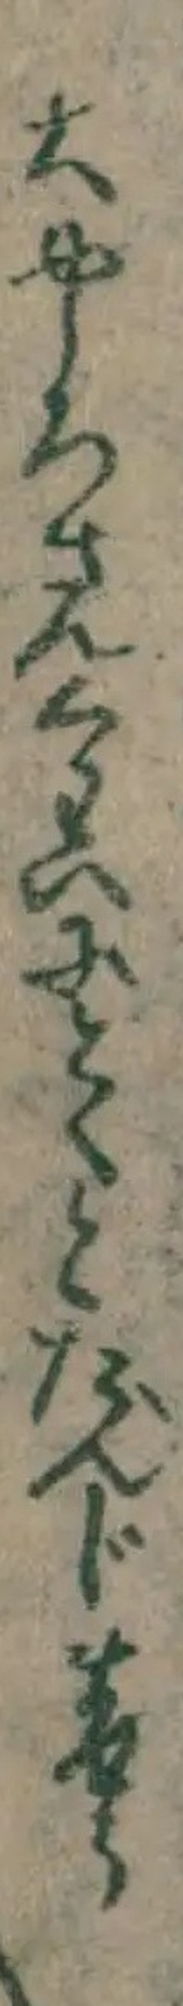大やしろさんくわいにとくとだんじませう

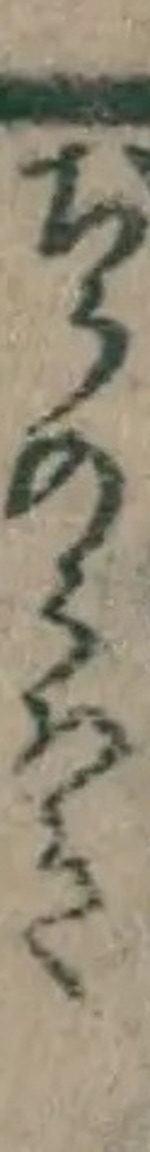ぢうのうはき
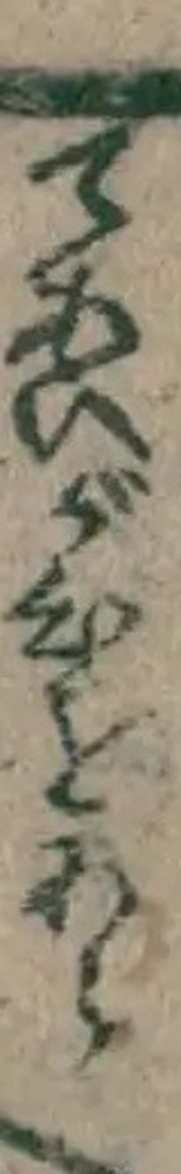てあいが心をあら
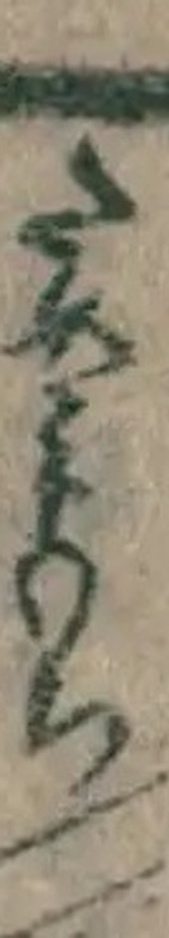ためみもち
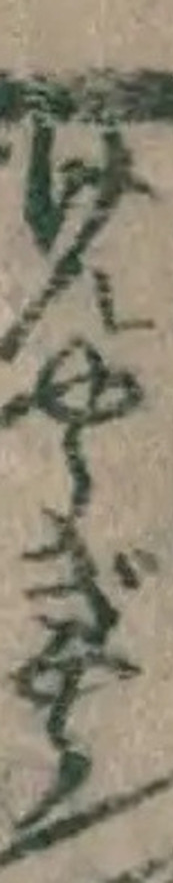けんやうぎやう
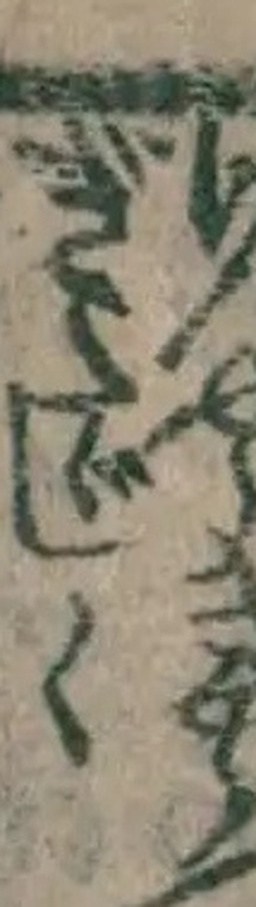ぎたゞしく
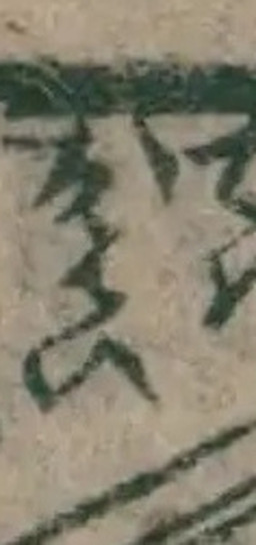おはい
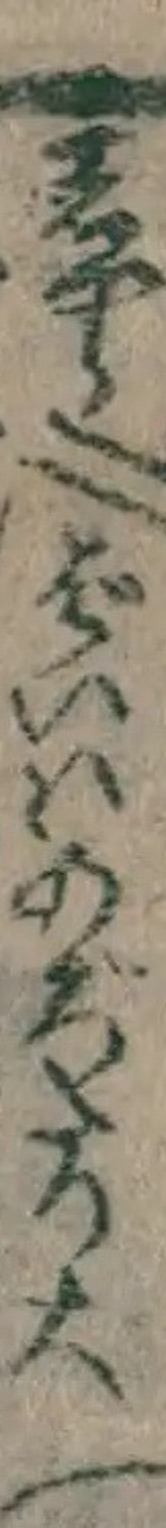しやうばいはあがつたり大
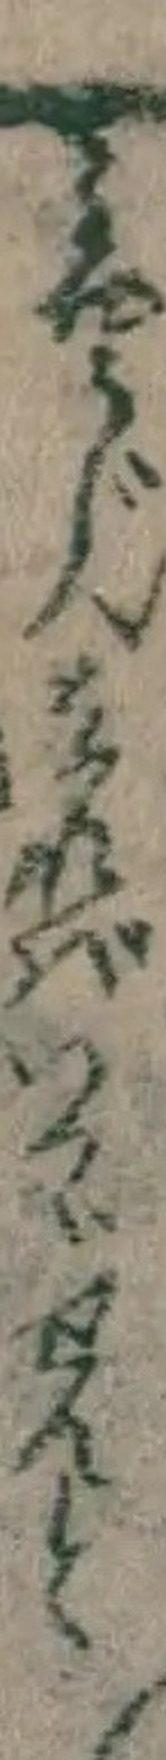みやうじんなればいかゞせんと
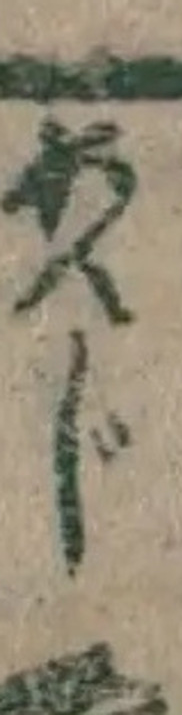あんじ
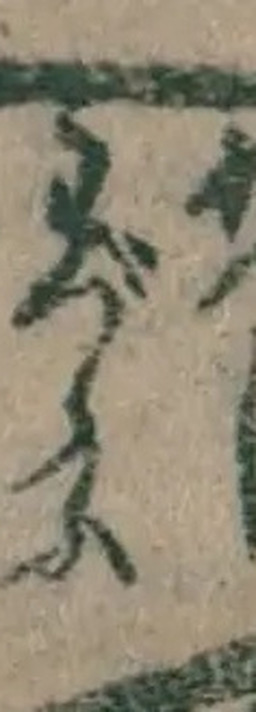わづらふ
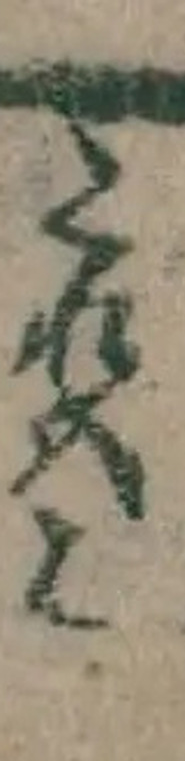これはこ
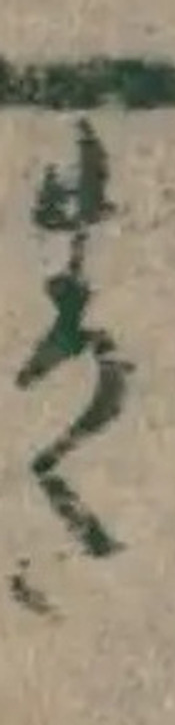まつた
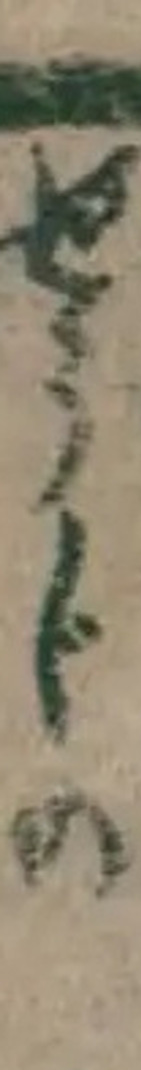せうじの
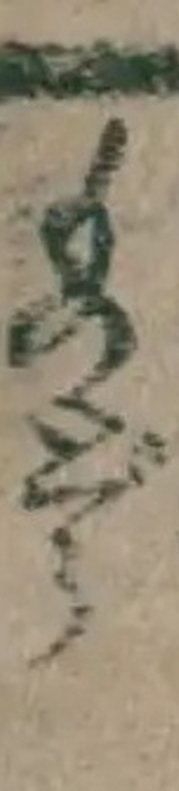ものどう
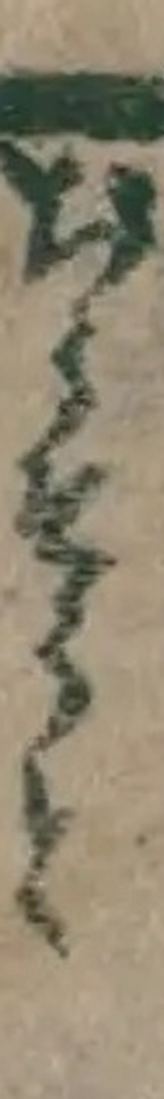ぢうそうと
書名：頓作時雨月 3巻
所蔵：国立国会図書館 National Diet Library, JAPAN
